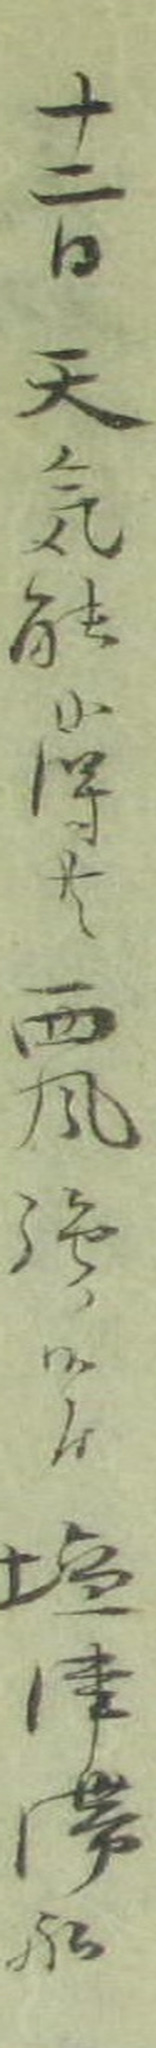十二日天気能候得共西風強く候に付塩津滞船
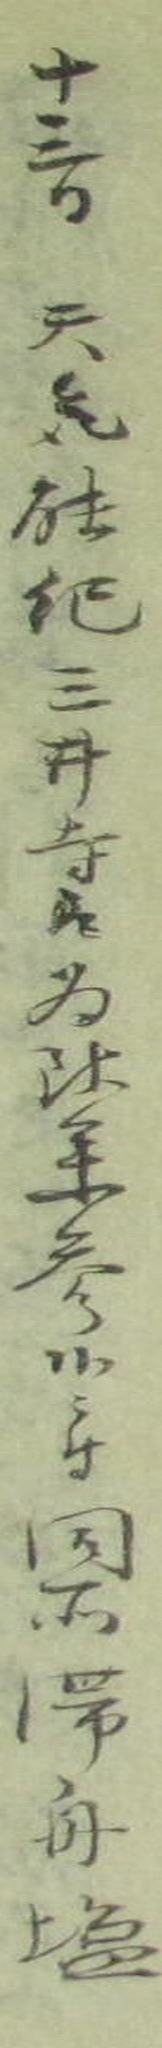十三日天気能紀三井寺被為致集参候に付同所滞舟塩
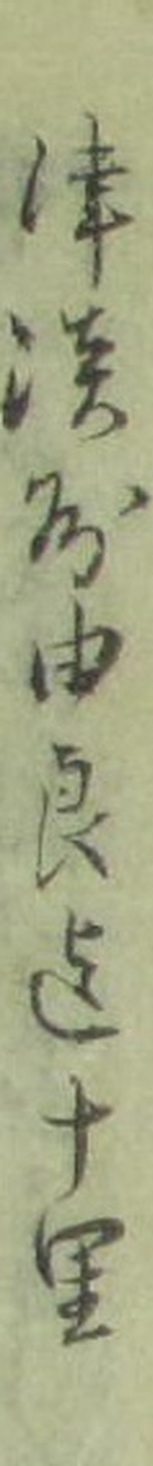津淡州由良迄十里
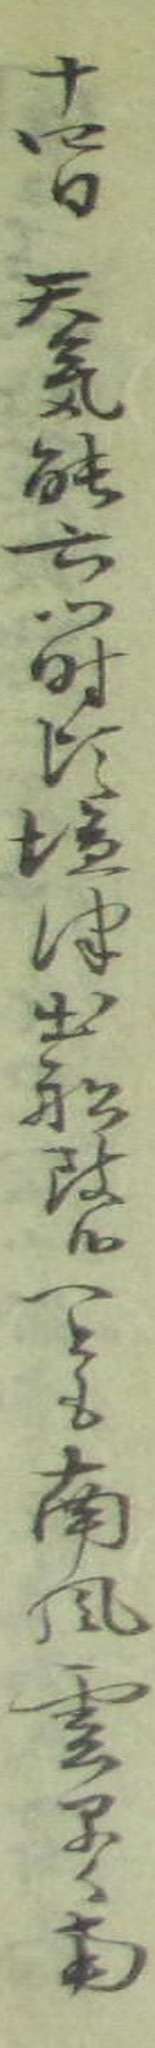十四日天気能六ツ時頃塩津出船致候へとも南風雲早く南

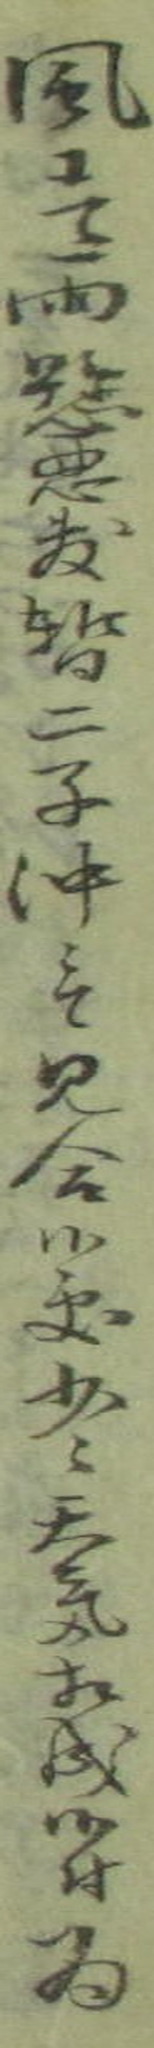風にて雨懸悪敷暫二子沖にて見合候処少々天気相成候付為
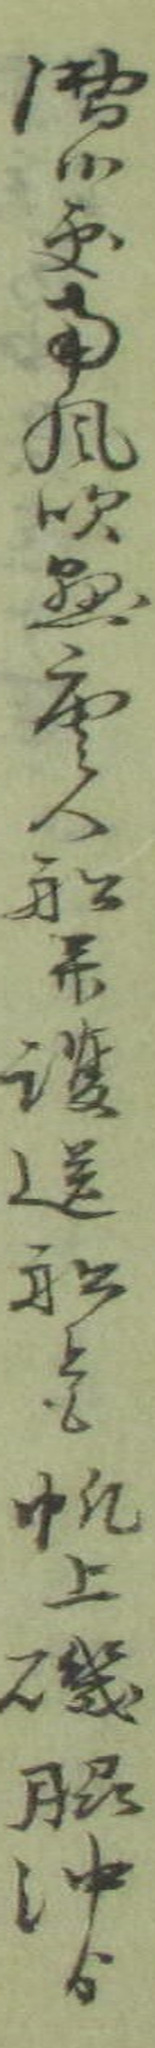漕候処南風吹懸唐人船幷護送船とも帆上磯脇沖ゟ
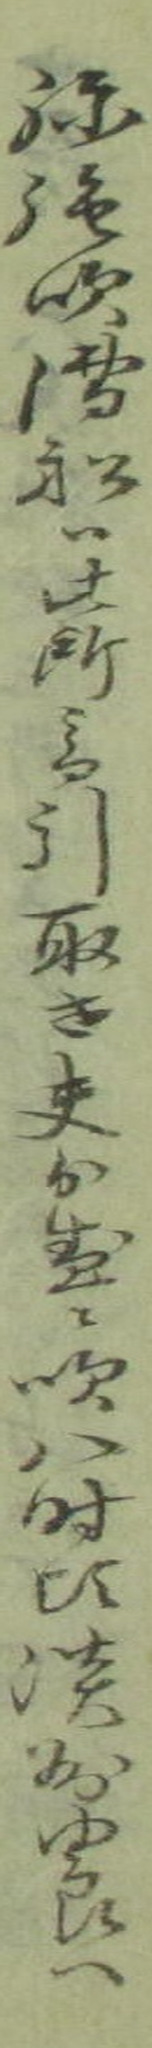弥強吹漕船は此所に而引取遣夫ゟ盛に吹八時頃淡州由良へ
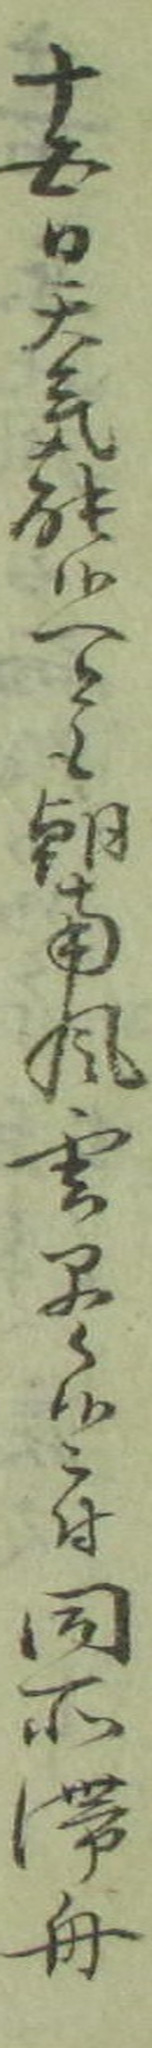十五日天気能候へとも朝南風雲早く候に付同所滞舟
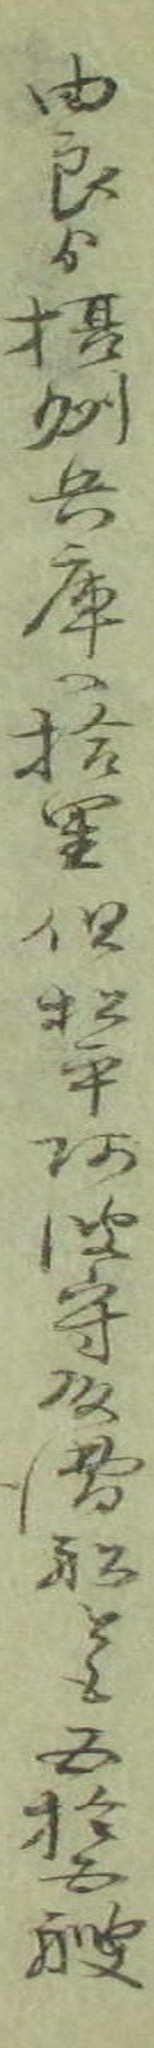由良ゟ摂州兵庫へ拾里但松平阿波守殿借船とも五拾五艘
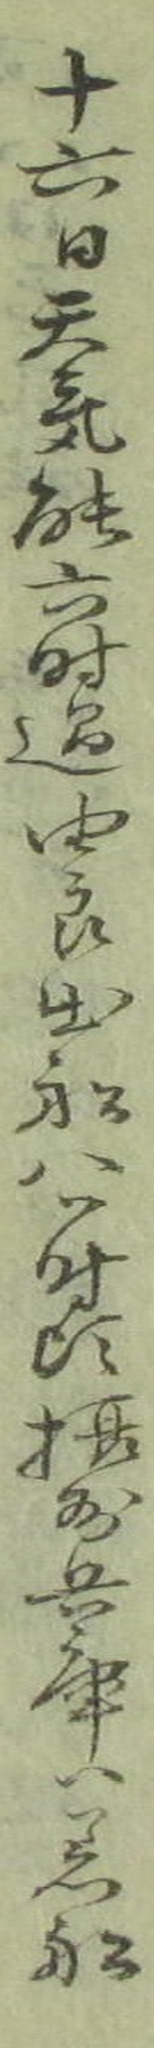十六日天気能六時過由良出船八ツ時頃摂州兵庫へ着船
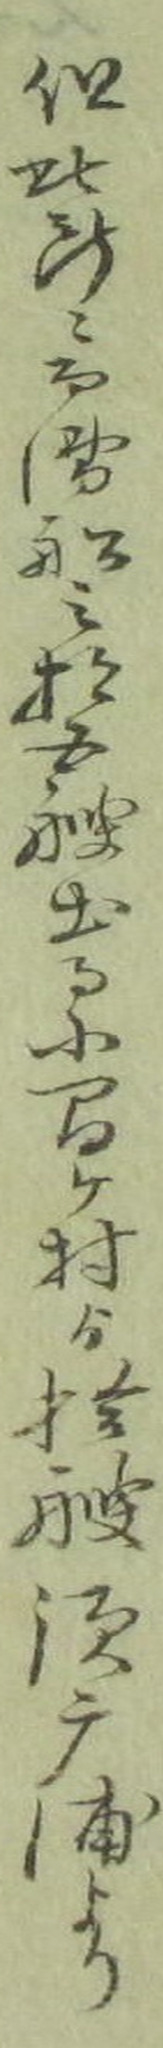但此所に而漕船之拾五艘出る小間ケ村ゟ拾艘須磨浦より
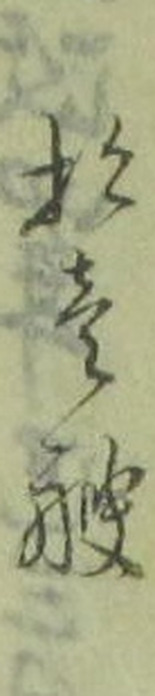拾壱艘
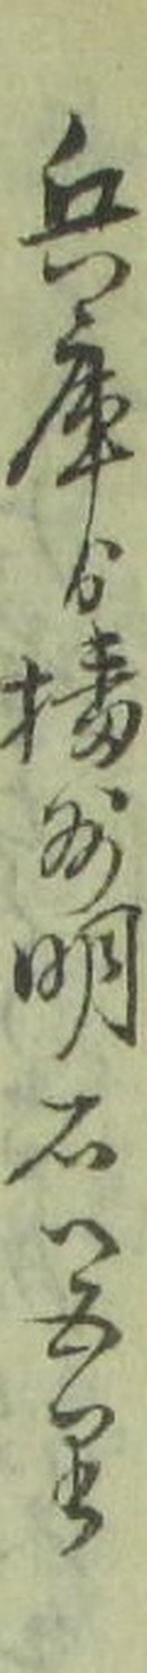兵庫ゟ播州明石へ五里
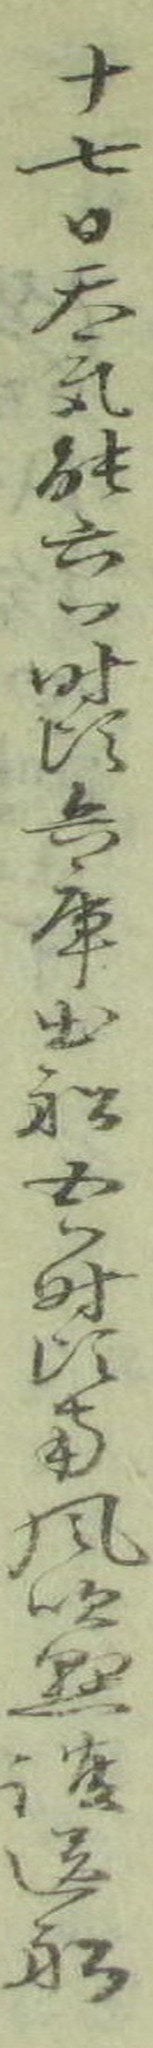十七日天気能六ツ時頃兵庫出船五ツ時頃南風吹懸護送船
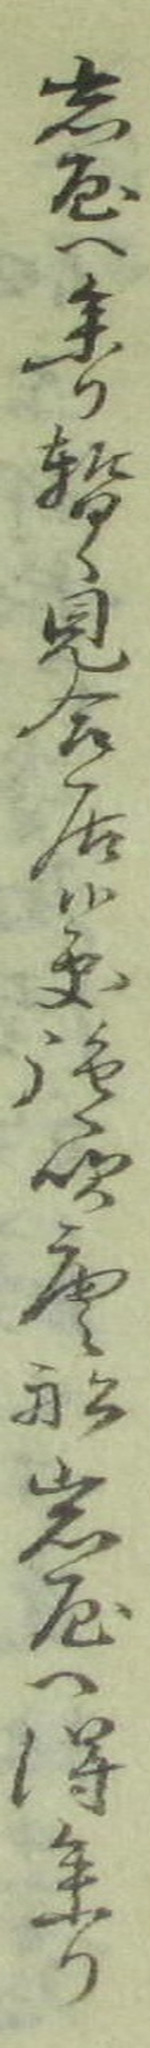志屋へ集り暫く見合居候処強く吹唐之船岩屋へ得集り
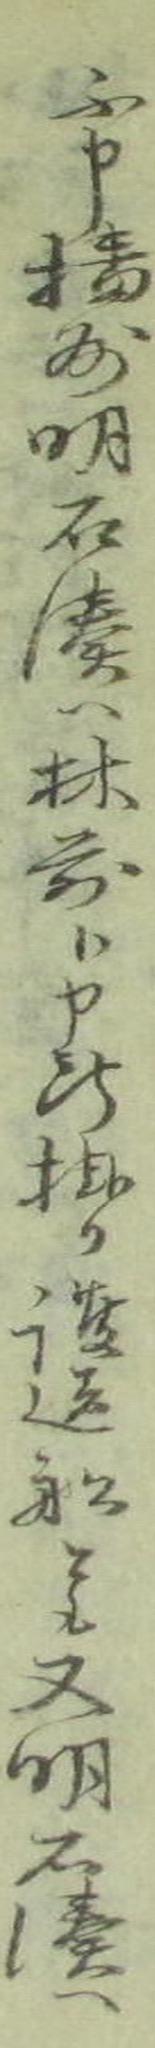不申播州明石湊へ林前ト申所掛り護送船とも又明石湊へ
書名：紀州九木浦庄屋記録 四
